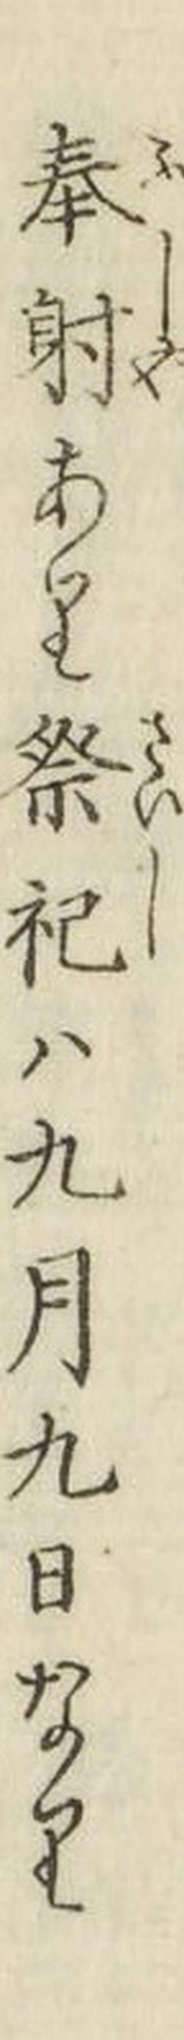奉射あり祭祀は九月九日なり
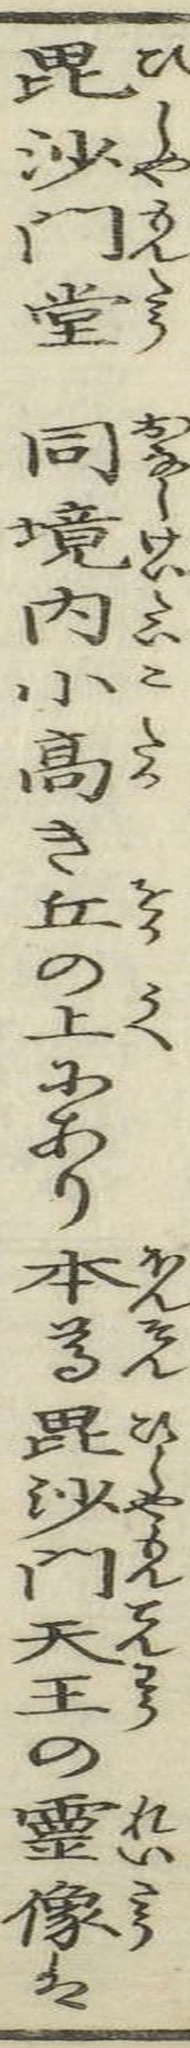毘沙門堂同境内小高き丘の上にあり本尊毘沙門天王の霊像は
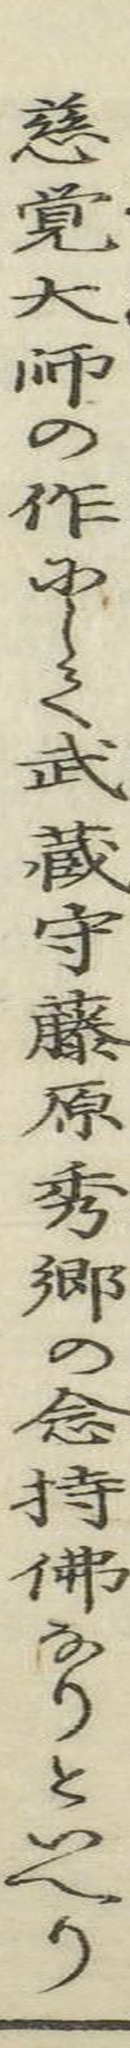慈覚大師の作にして武蔵守藤原秀郷の念持仏なりといへり
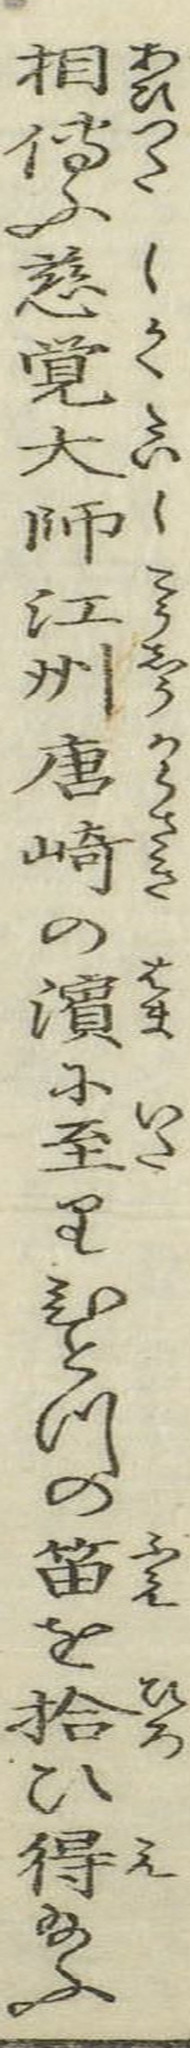相伝ふ慈覚大師江州唐崎の浜に至りひとつの笛を拾ひ得給ふ
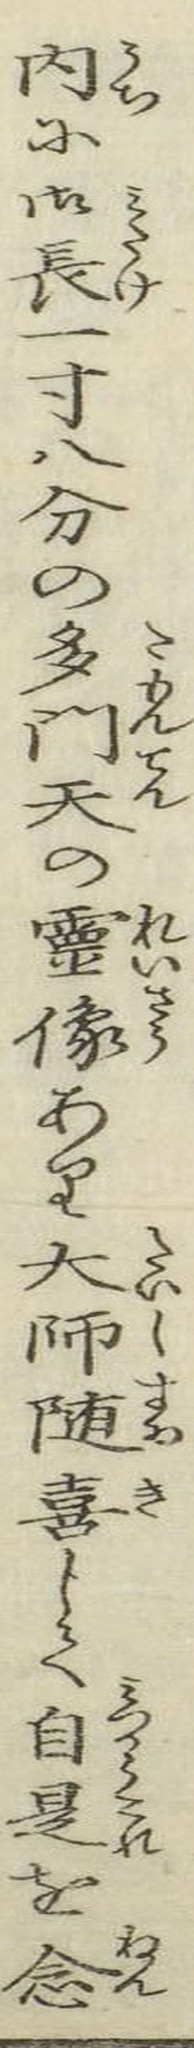内に御長一寸八分の多聞天の霊像あり大師随喜して自是を念
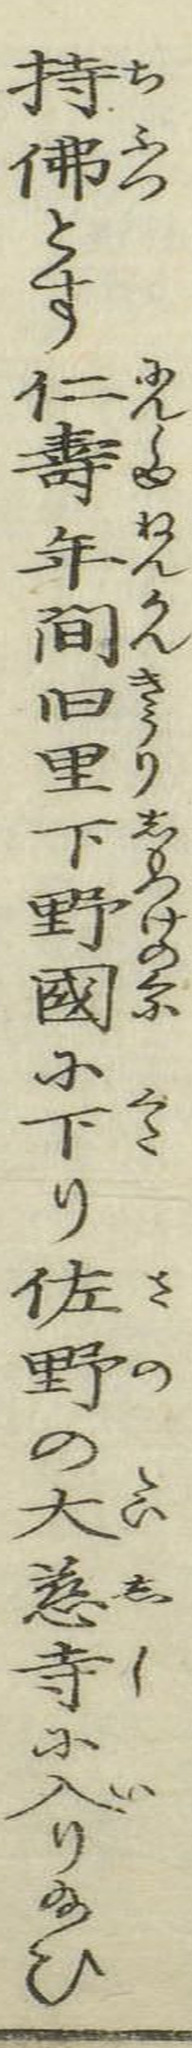持仏とす仁寿年間旧里下野国に下り佐野の大慈寺に入り給ひ
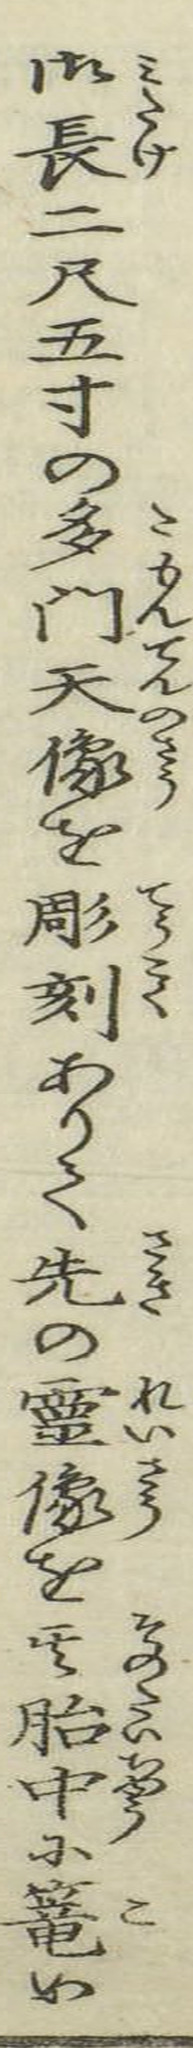御長二尺五寸の多聞天像を彫刻ありて先の霊像を其胎中に篭め
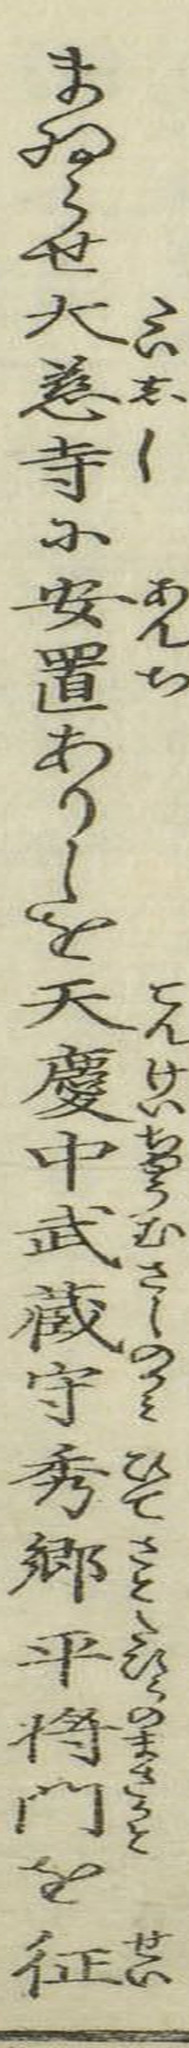まゐらせ大慈寺に安置ありしを天慶中武蔵守秀郷平将門を征

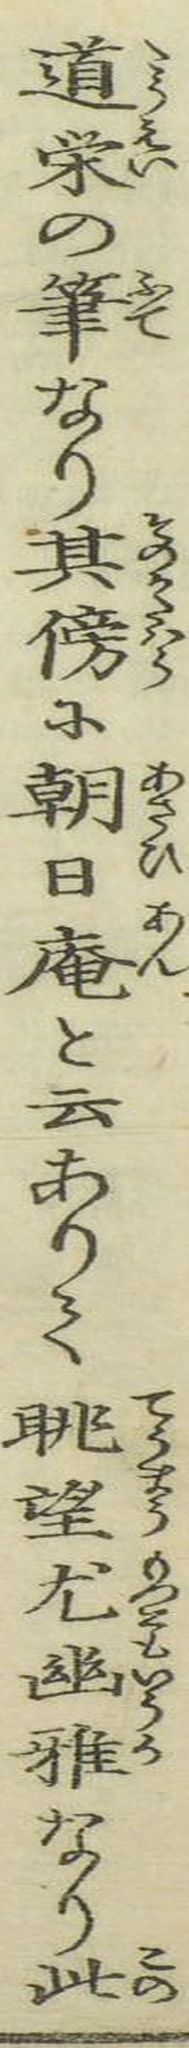道栄の筆なり其傍に朝日庵と云ありて眺望尤幽雅なり此
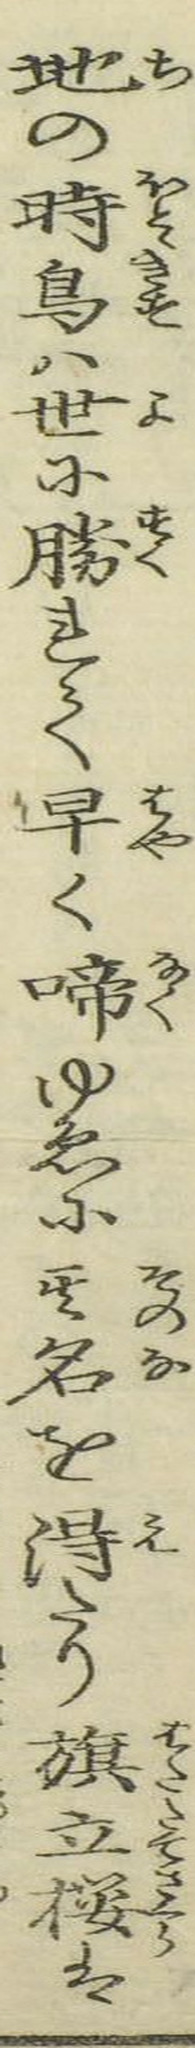地の時鳥は世に勝れて早く啼ゆゑに其名を得たり旗立桜は
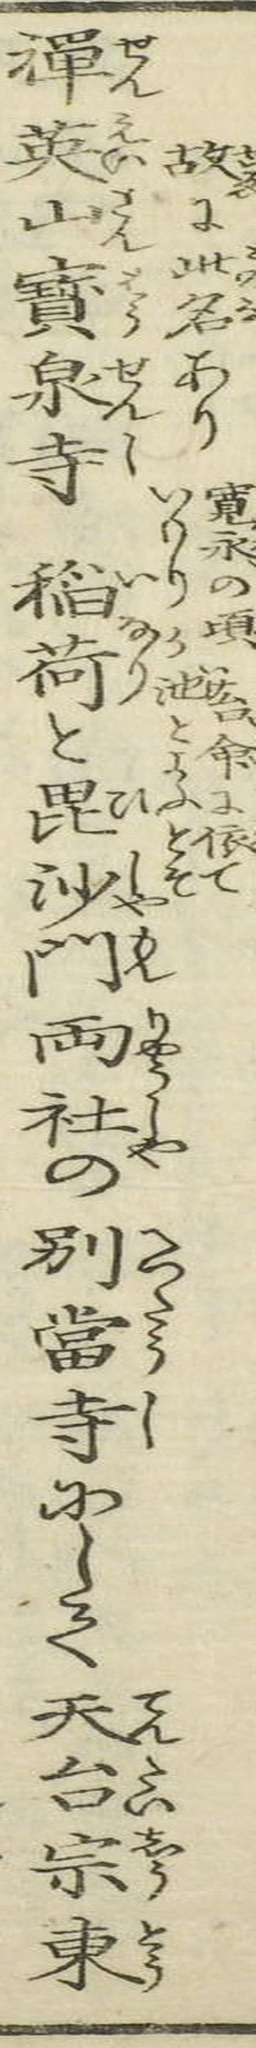禅英山宝仙寺稲荷と毘沙門両社の別当寺にして天台宗東
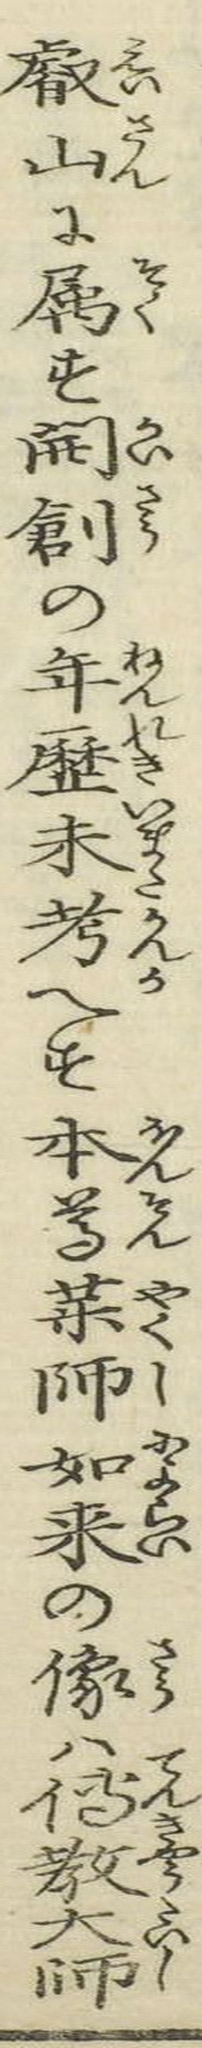叡山に属す開創の年歴未考へす本尊薬師如来の像は伝教大師
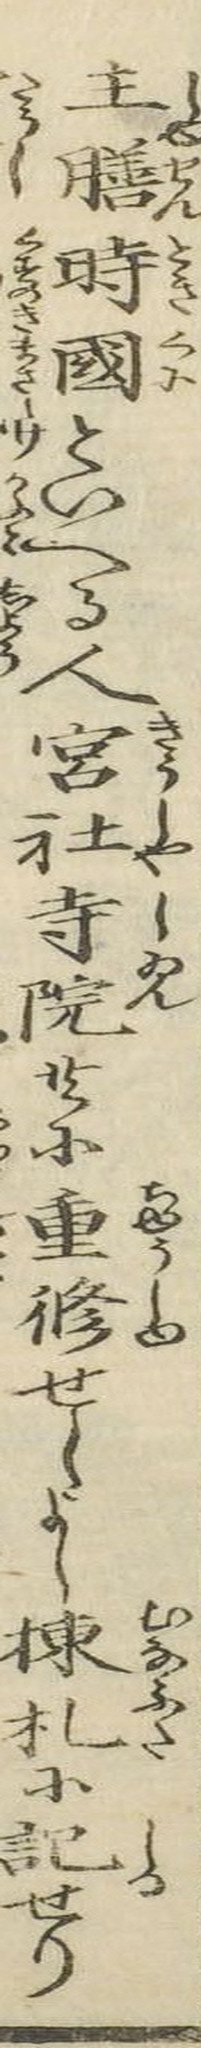主膳時国といへる人宮社寺院共に重修せしよし棟札に記せり
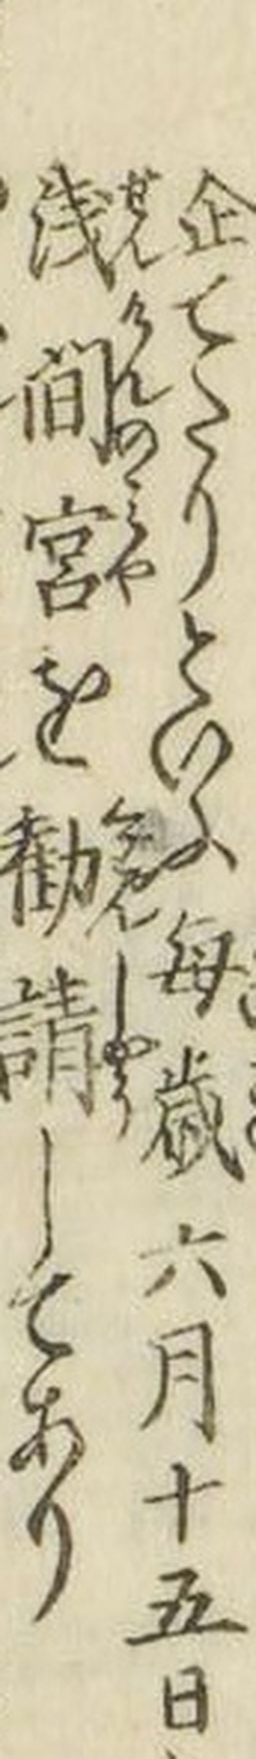浅間宮を勧請してあり
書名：江戸名所図会 20巻 巻之11
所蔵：東京学芸大学教育コンテンツアーカイブ
